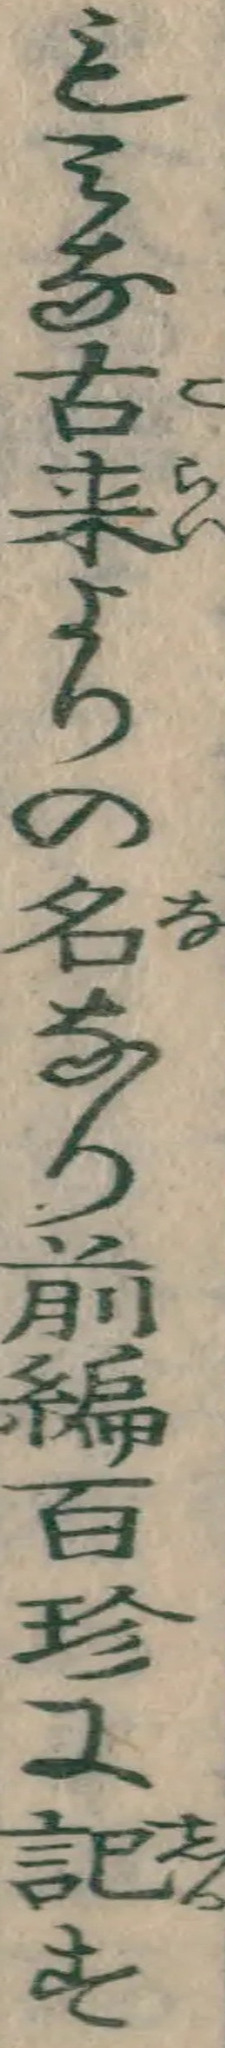もみな古来よりの名なり前編百珍に記す
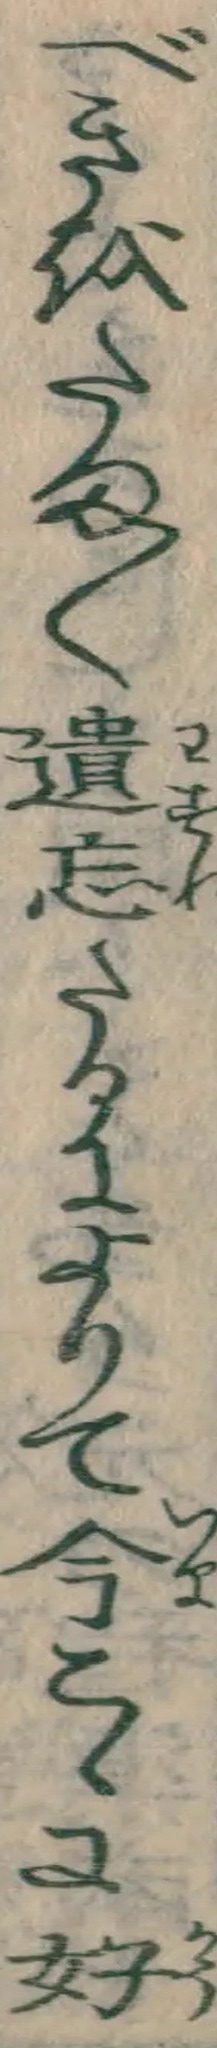べきをたま〳〵遺忘たるによりて今こゝに好
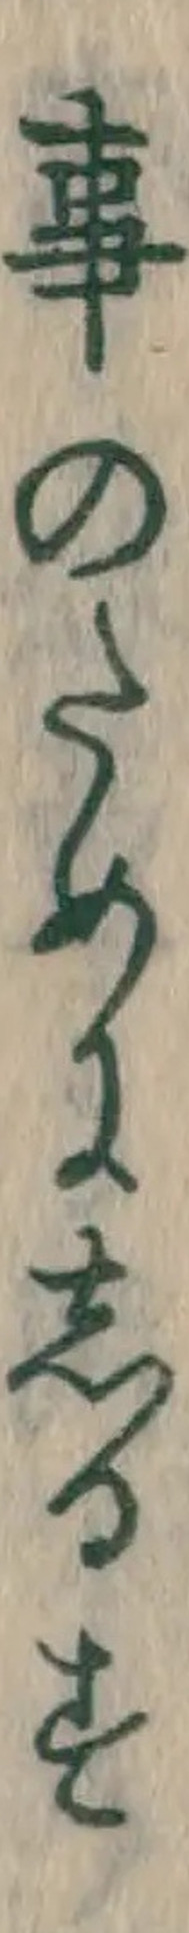事のためにしるす
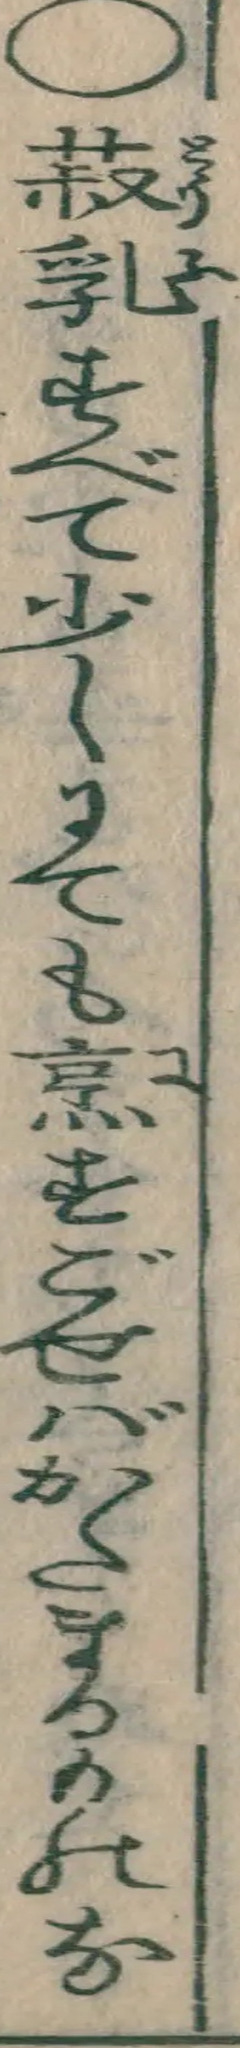○菽乳すべて少しにても烹すごせばかたまるものな
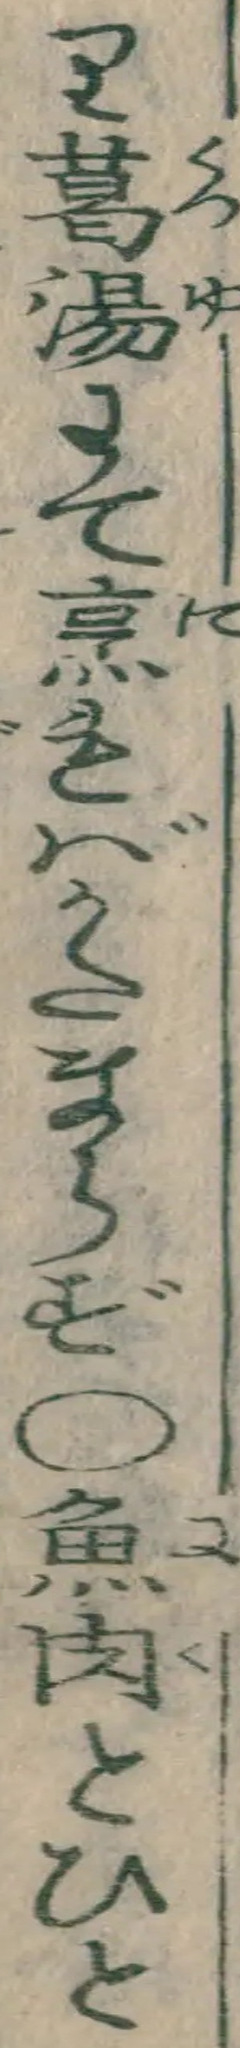り葛湯にて烹ればかたまらず○魚肉とひと
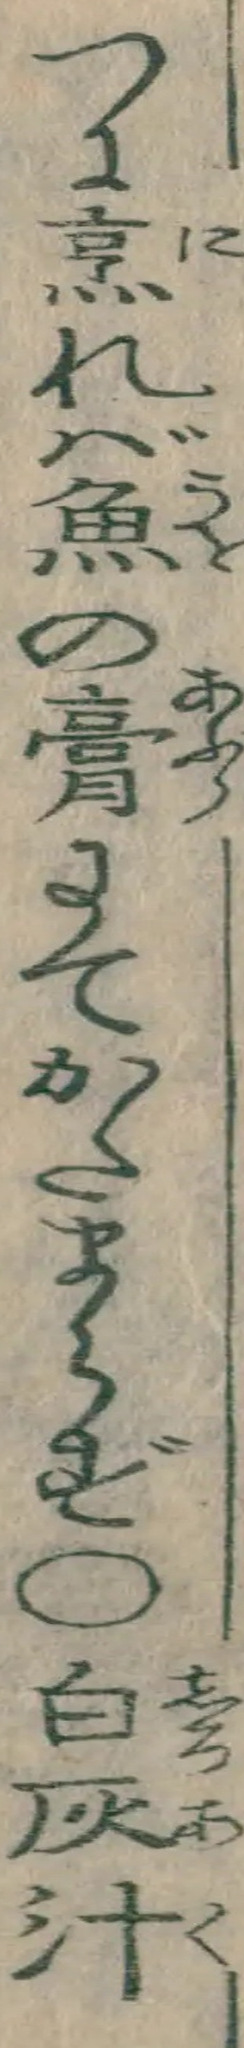つに烹れば魚の膏にてかたまらず○白灰汁

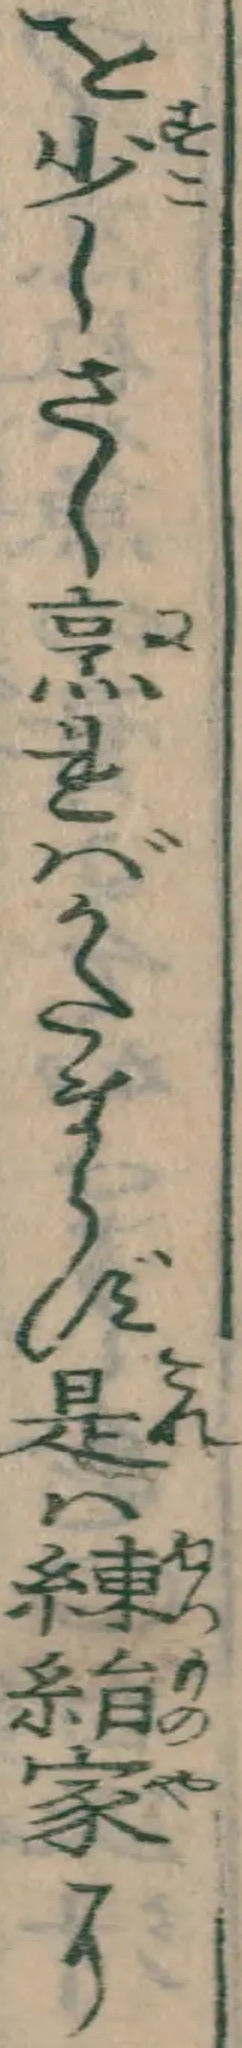を少しさし烹ればかたまらず是は練絹家に
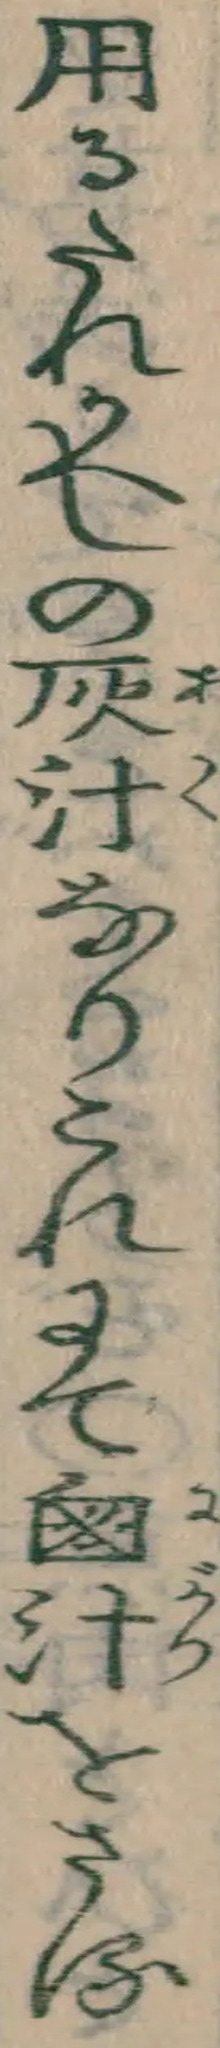用るたれかへしの灰汁なりこれにて鹵汁をさる
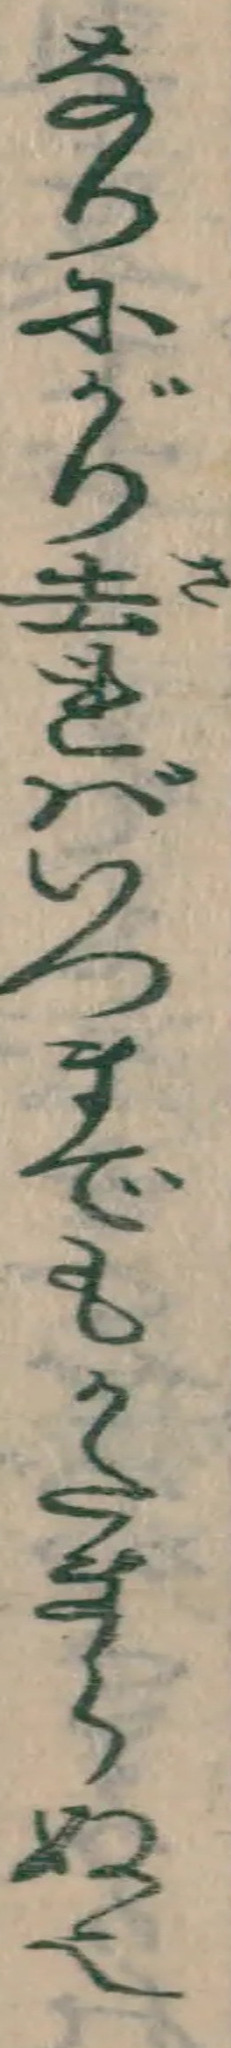なりにがり去ればいつまでもかたまらぬ也
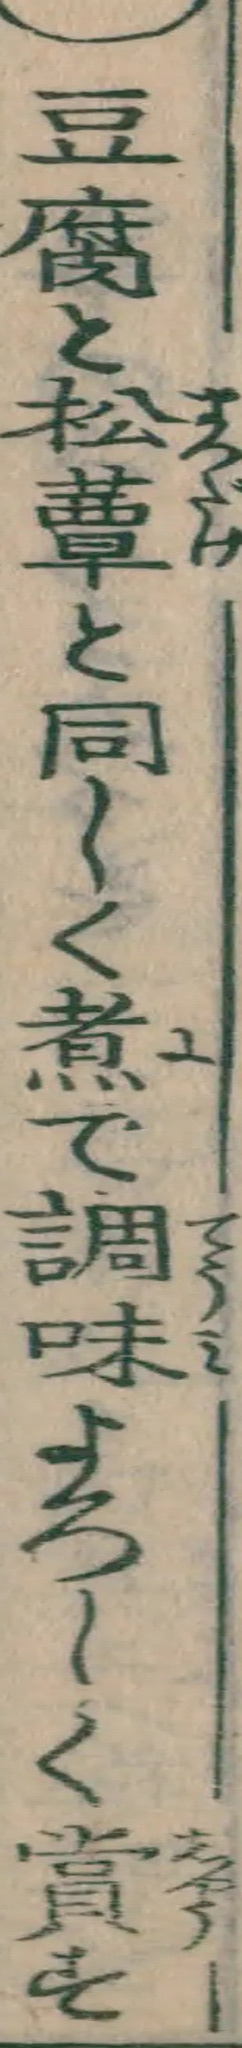○豆腐と松蕈と同しく煮て調味よろしく賞す
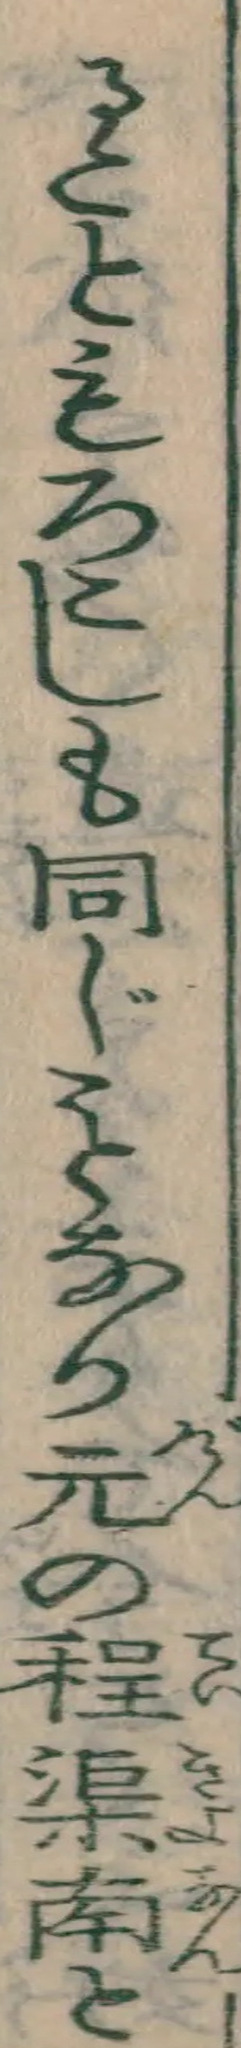ることもろこしも同じことなり元の程渠南と
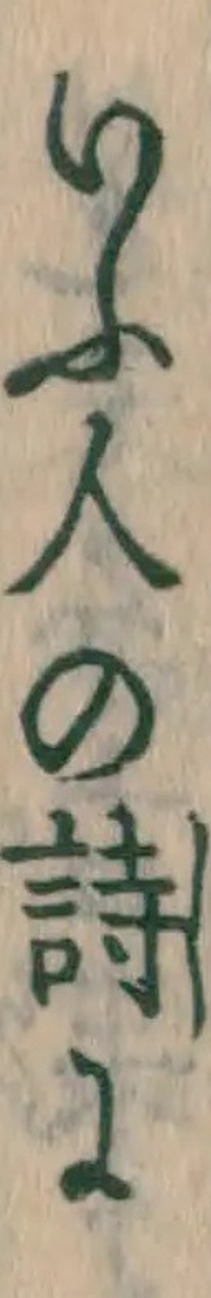いふ人の詩に
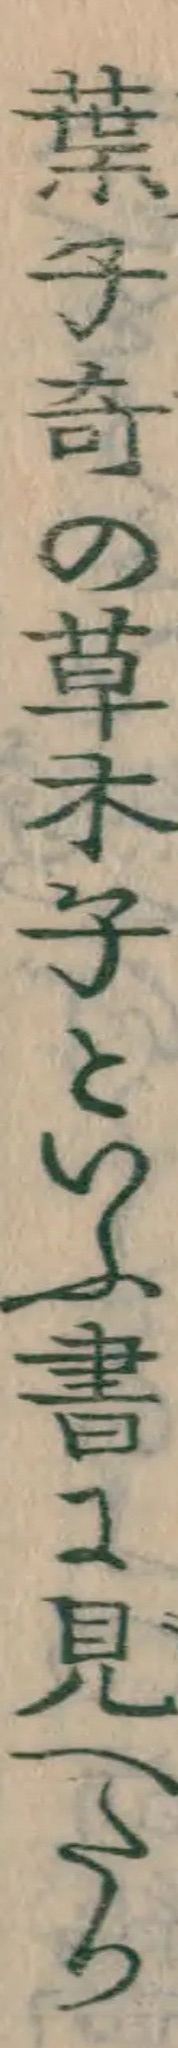葉子奇の草木子といふ書に見へたり
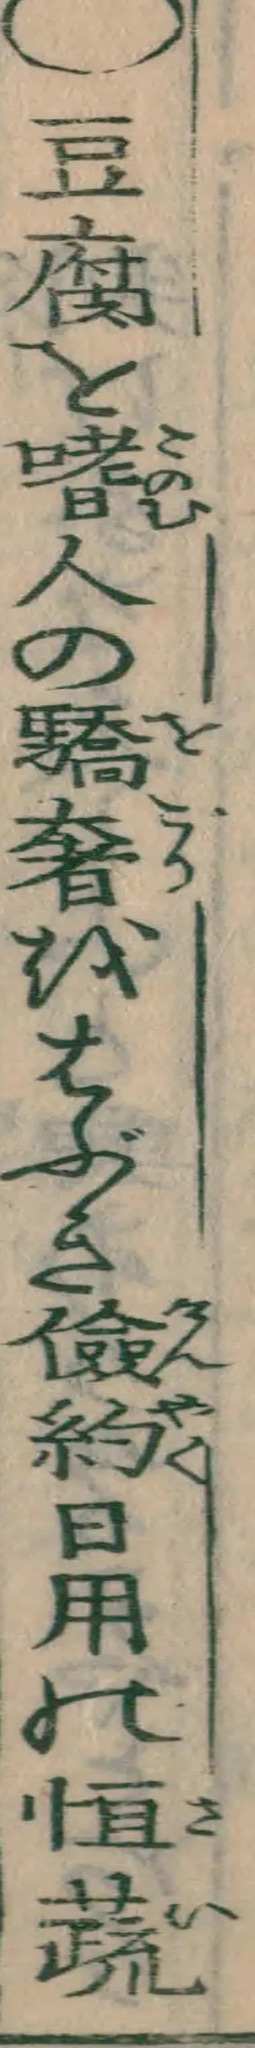○豆腐を嗜人の驕奢をはぶき倹約日用の恒蔬
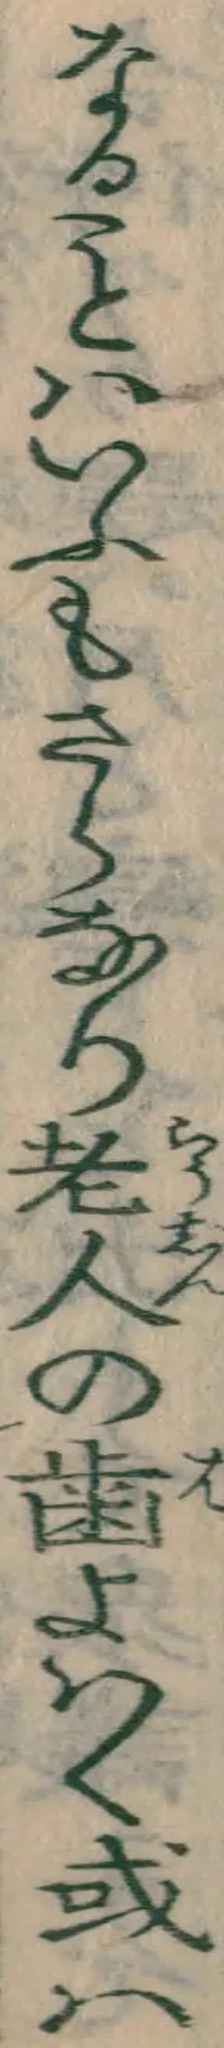なることはいふもさらなり老人の歯よはく或は
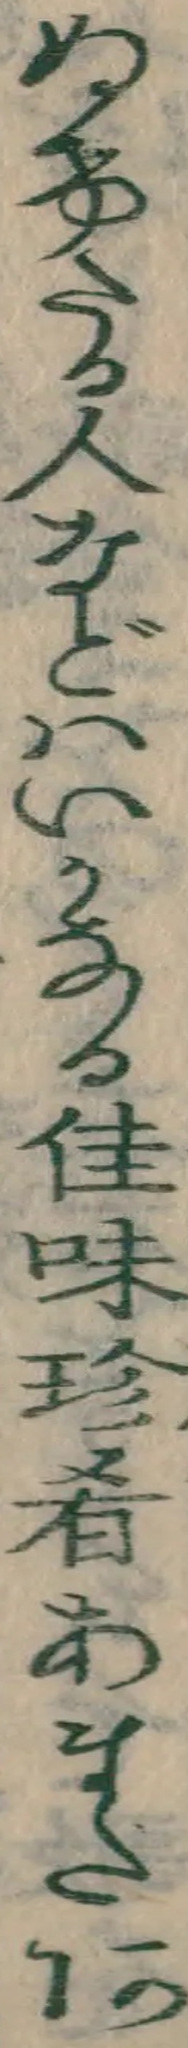ぬけたる人などはいかなる佳味珍肴あまたあ
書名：豆腐百珍. 続編
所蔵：国立国会図書館 National Diet Library, JAPAN
